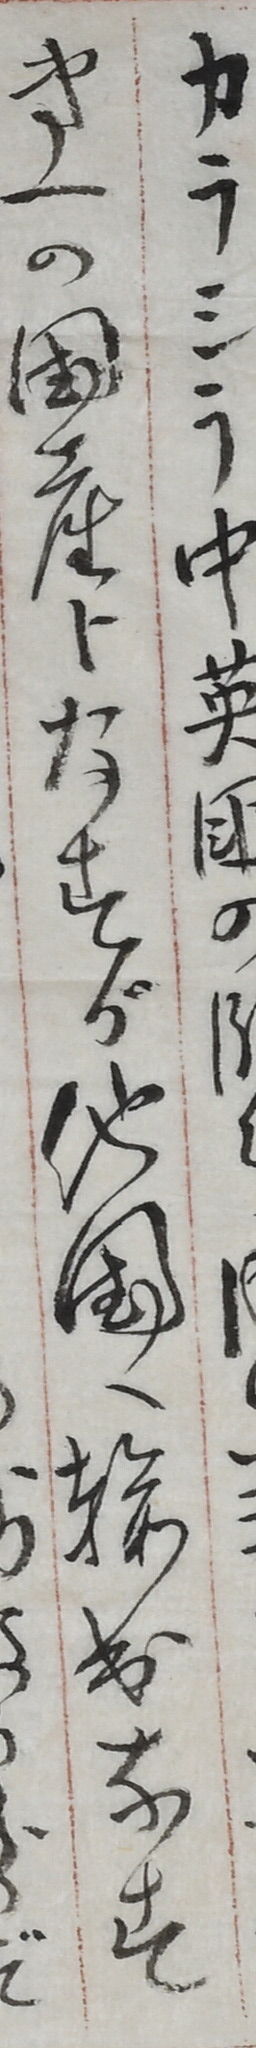第一の国産トなすが他国へ輸出なす
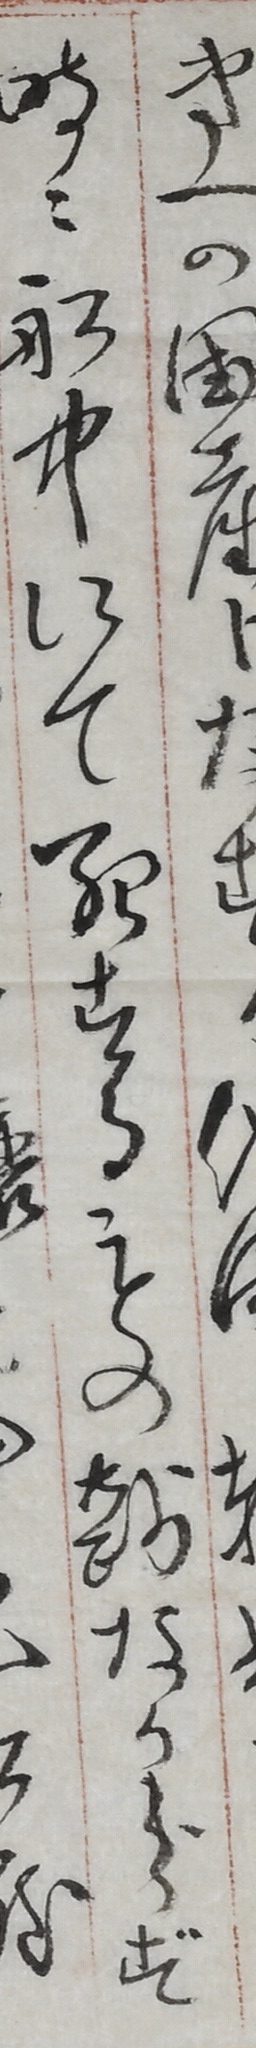時に船中にて死するもの尟なからず
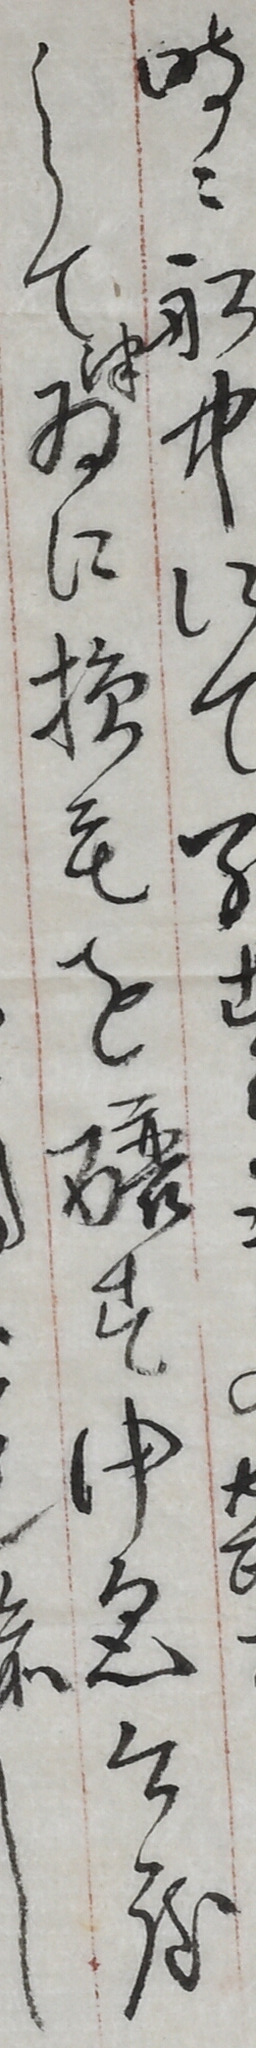してつゐに損毛を醸すゆゑ今度
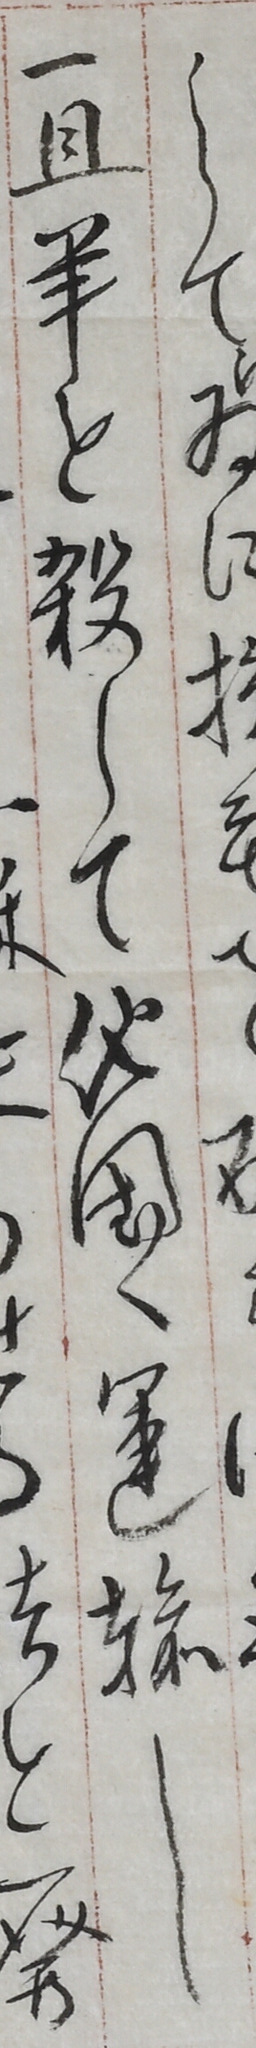一旦羊を殺して他国へ運輸して
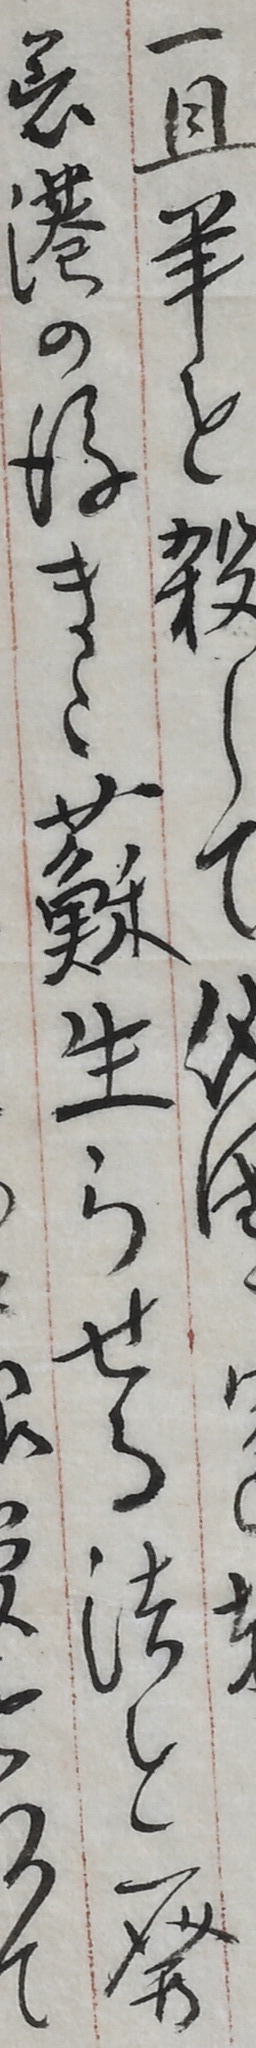着港の後の後また蘇生らせる法を発
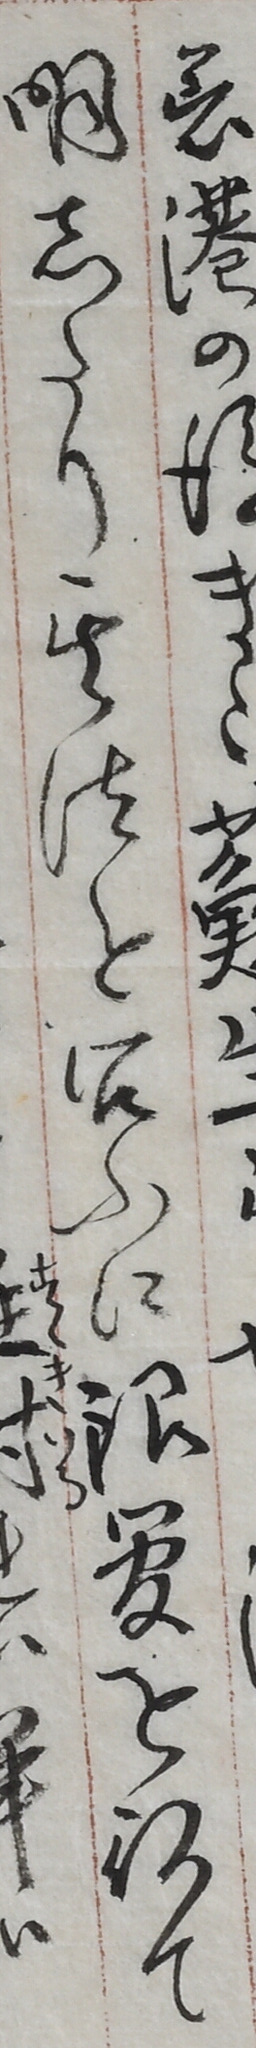明したり其法を問ふに銀管を以て
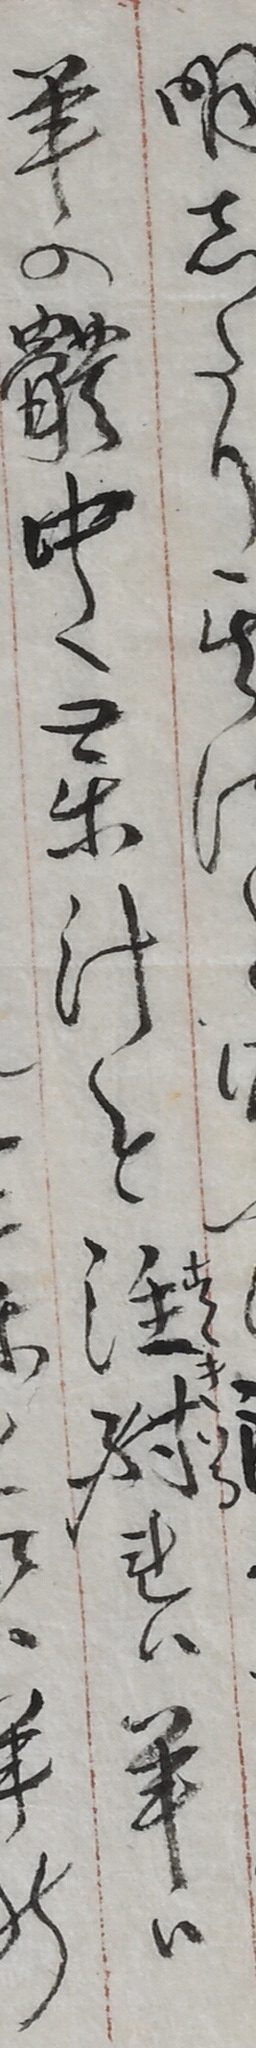羊の体中へ薬汁を注射れは羊は
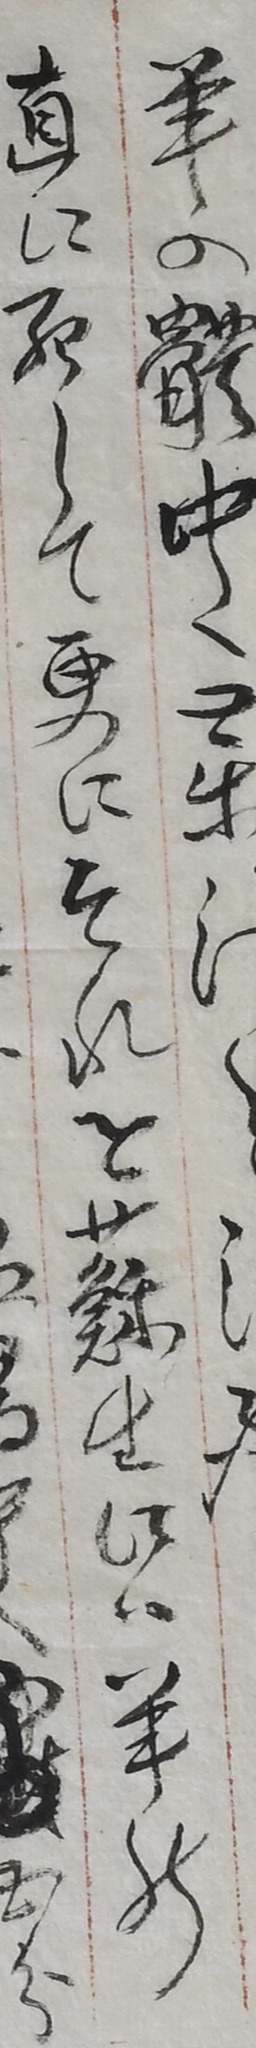直に死して更にそれを蘇生すは羊の
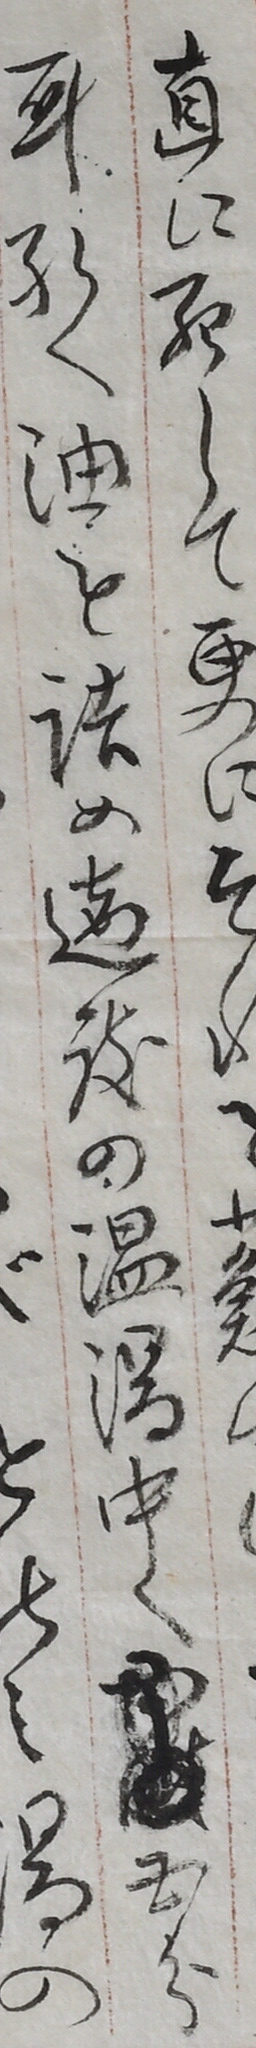耳孔へ油を詰め適度の温湯中へ五分
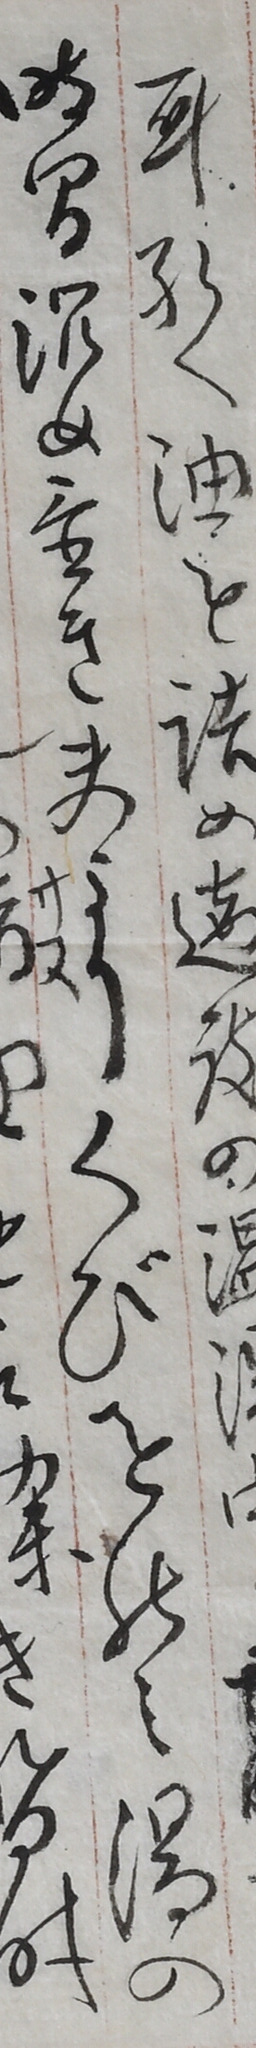時間沈め置き夫よりくびをみ湯の
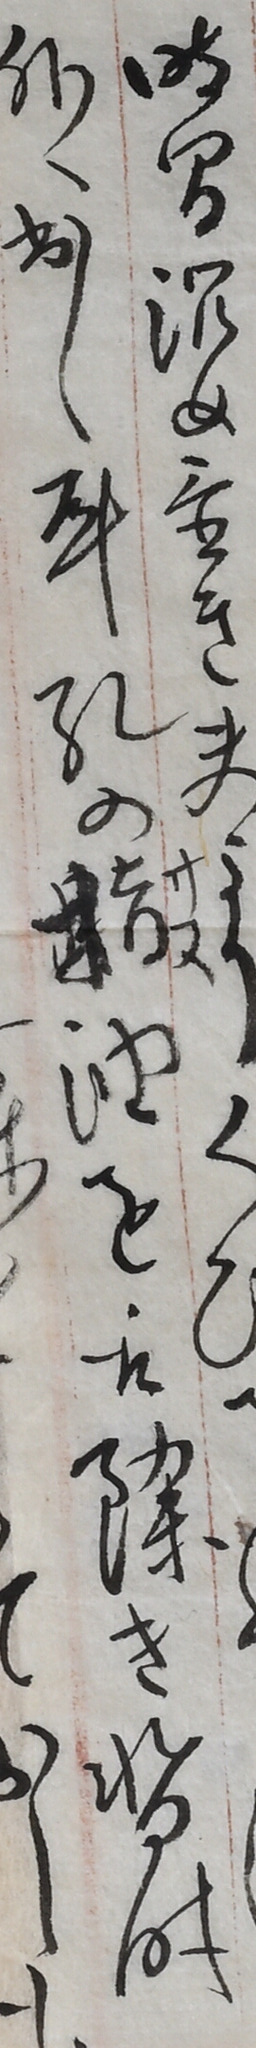外へ出し耳孔の指油を取除き暫時
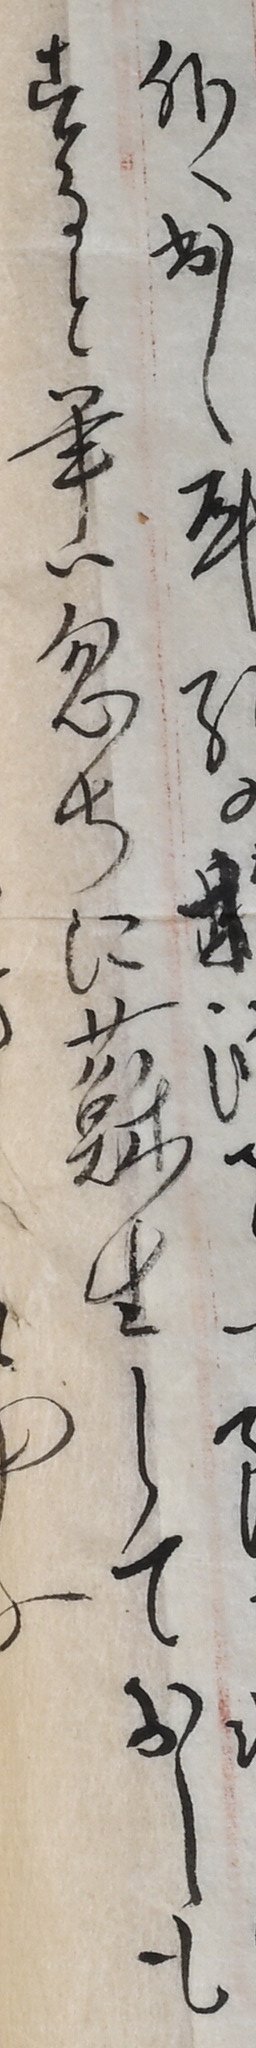すると未は忽ちに蘇生して少しも
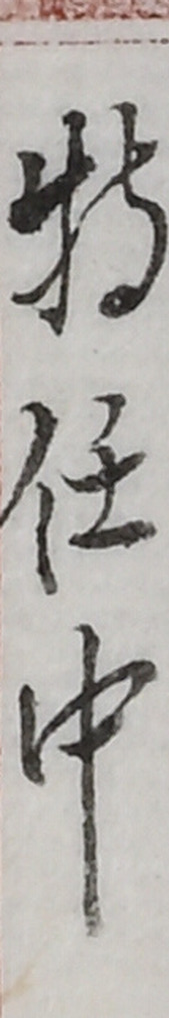特任中
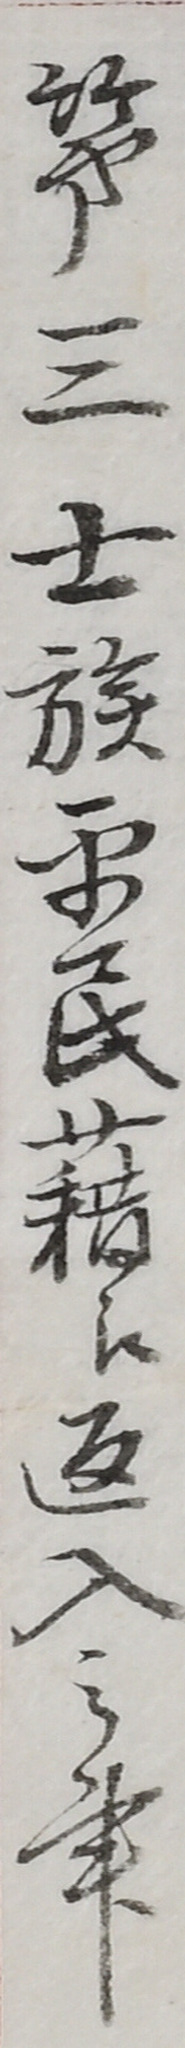第三士族平民籍江返入之事
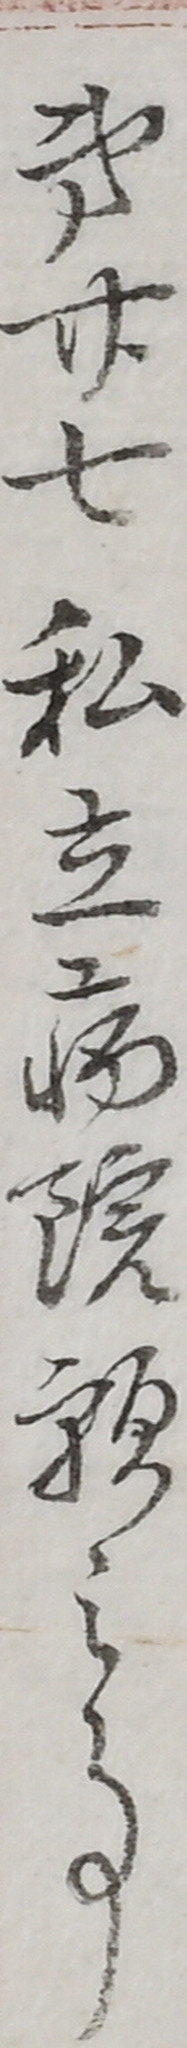第廿七私立病院願之事
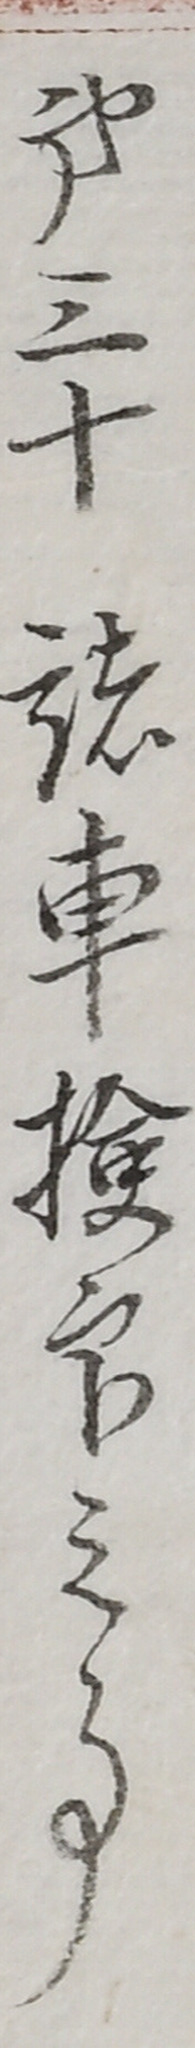第三十諸車検印之事
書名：郡役所勤務中御用抜書
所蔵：伊那市立高遠町図書館・合同会社AMANE
